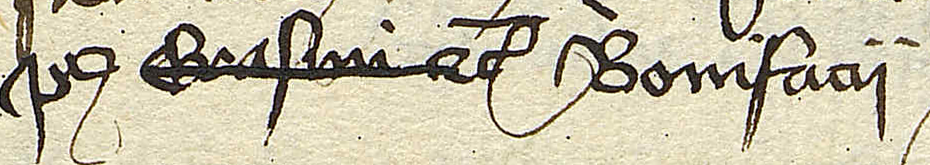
p* Eraſim ec* Bonifacii /
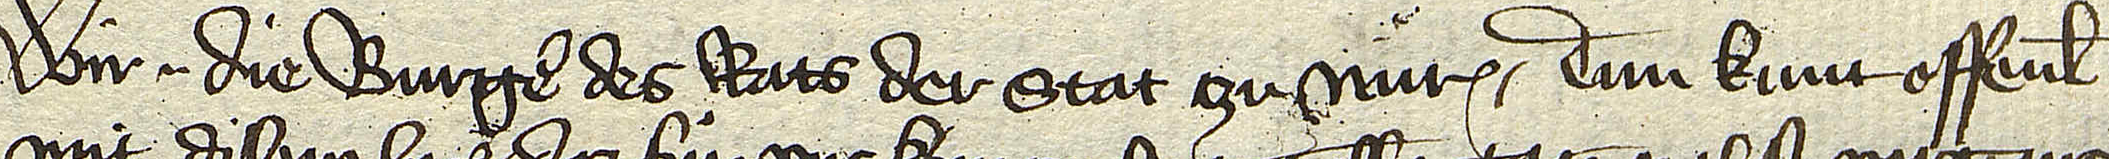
Wir ~ die Burge* des Rats der Stat cʒu Nür* / Tun kunt offenl*
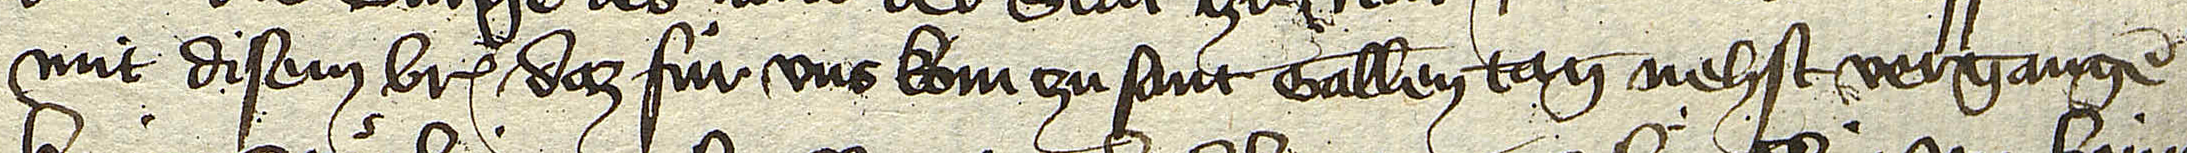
mit diſem br* / daʒ für vns kom cʒu ſant Gallen tag nehſ vergange*
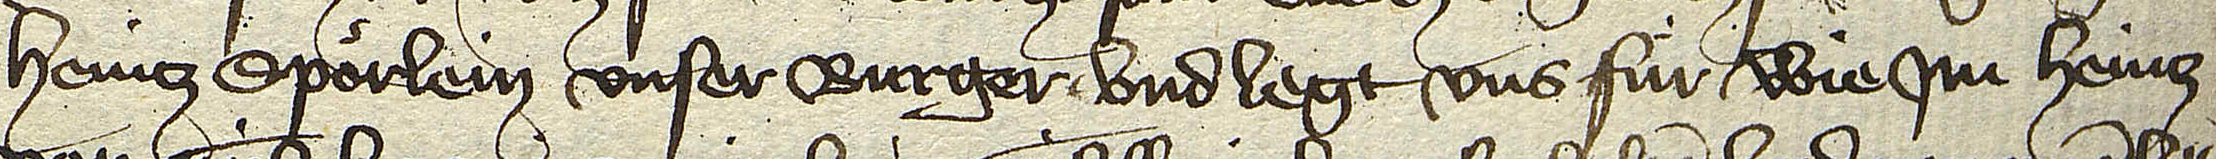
Heincʒ Spörlein vnſer Burger / vnd legt vns für / wie Im Heincʒ
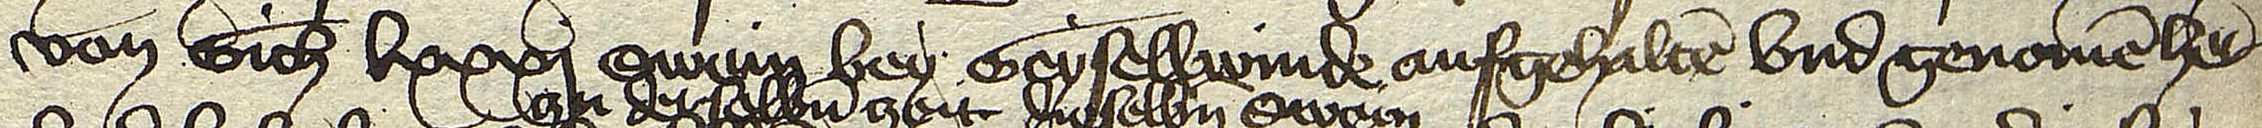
von Gich lxxxi Swein bey Geyſellwinde aufgehalte* vnd genome* het
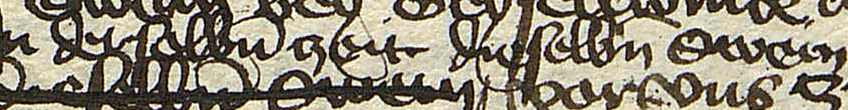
cʒu derſelbn* cʒeit dieſelbn* Swein
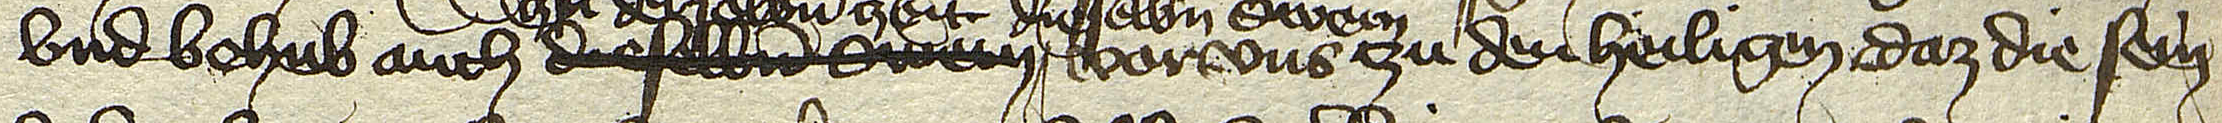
vnd behub auch dieſelbn Swein vor vns cʒu der heiligen / daʒ die ſein
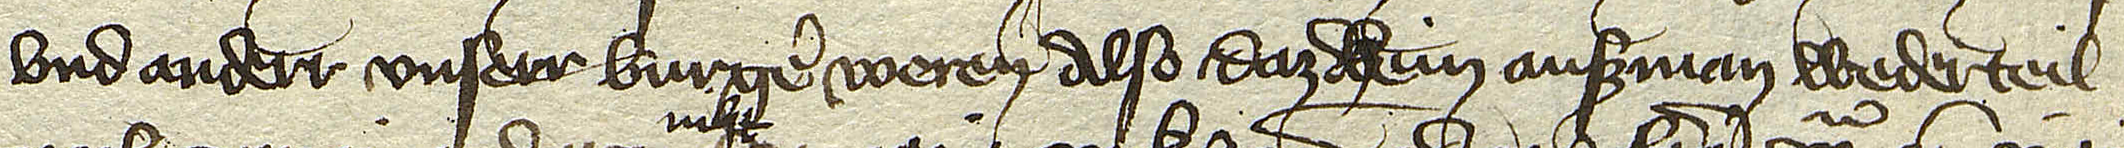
vnd anderr vnſerr burge* weren Alſo / daʒ dhein auſʒman wederteil
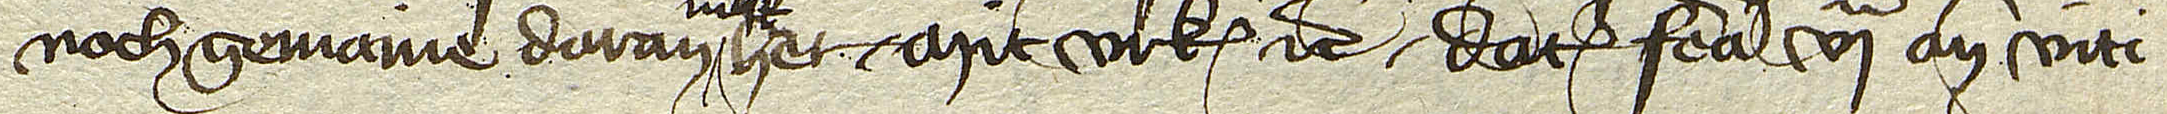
noch gemaine daran het / Mit vrk* ec* / dat* fea* vi* an* viti
